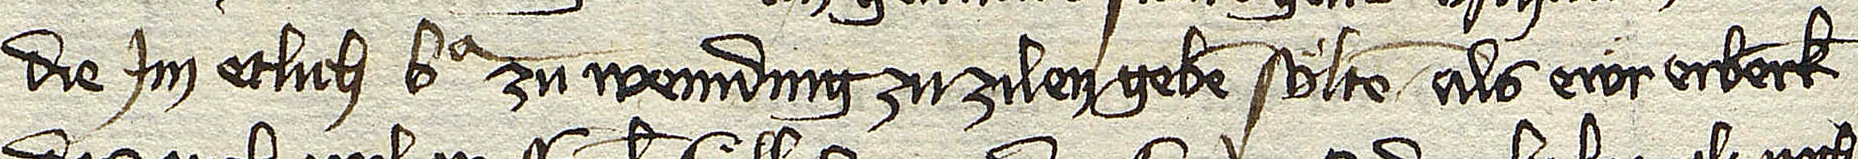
die Im etlich b* ʒu wemding ʒu ʒilen gebe* ſölte* / als ewr erberk*
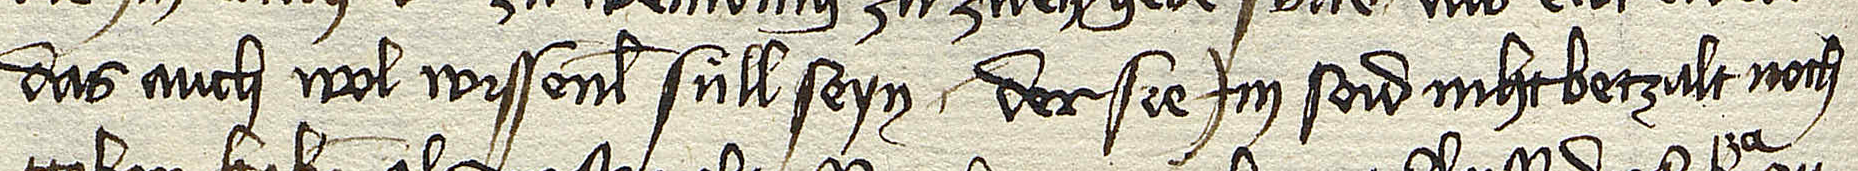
das auch wol wiſſenl* ſüll ſeyn / der ſie Im ſeid niht becʒalt noch
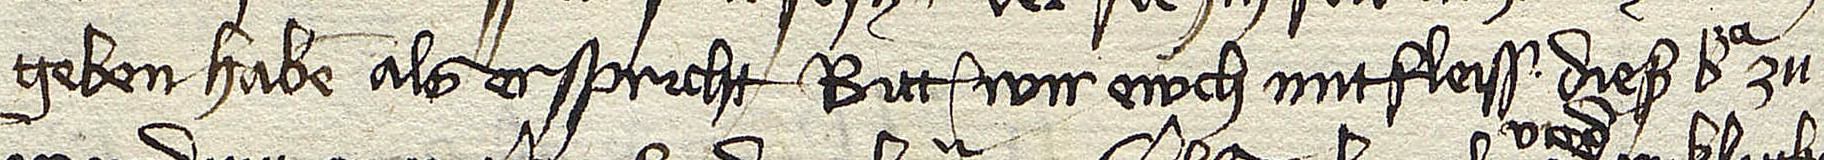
geben habe* als er ſpricht Bitt* wir ewch mit fleiſſ . dieſ* b* ʒu
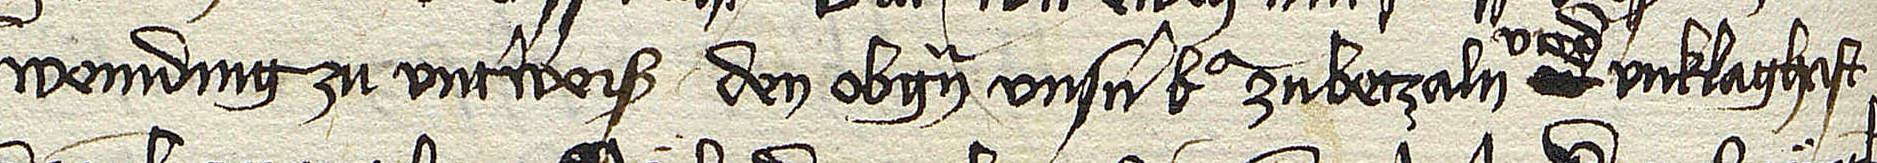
wemding ʒu vnt*weiſ* den obg*n vnſ*n b* ʒubecʒaln od* vnklaghaft
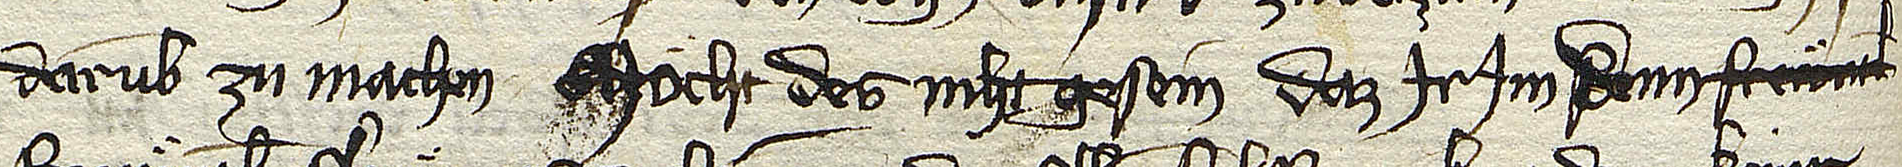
daru*b ʒu machen / Möcht des niht geſein daʒ Ir Im denn frewntl*
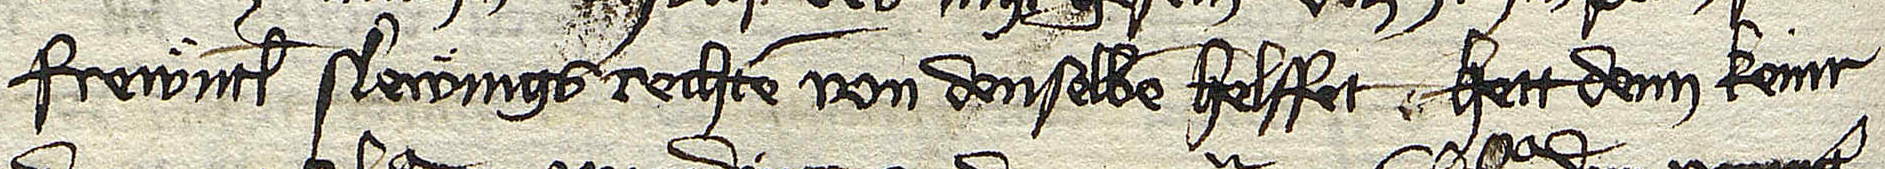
frewntl* ſlewnigs rechte* von denſelbe* helffet . hett den keinr
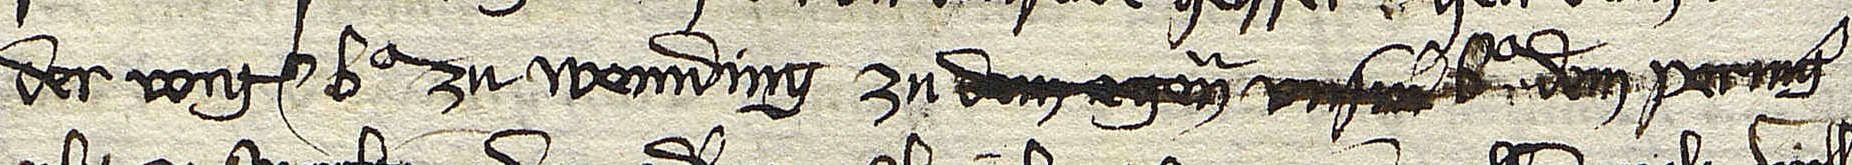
der vorg* b* ʒu wemding ʒu dem egen* vnſ*m b* ~ dem pernig*
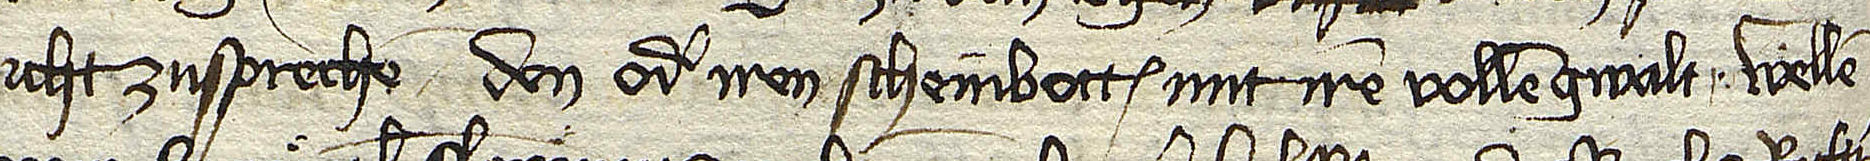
icht ʒuſpreche* / den od* iren ſcheinbott* mit ire* volle* gwalt . welle*
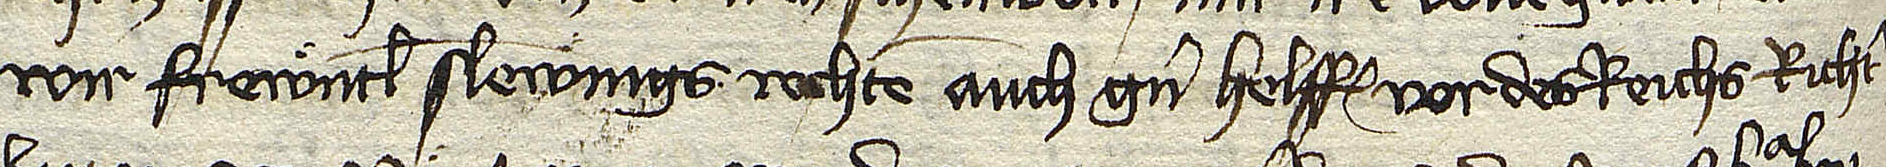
wir frewntl* ſlewnigs rechte* auch g*n helff* vor des Reichs Richt*
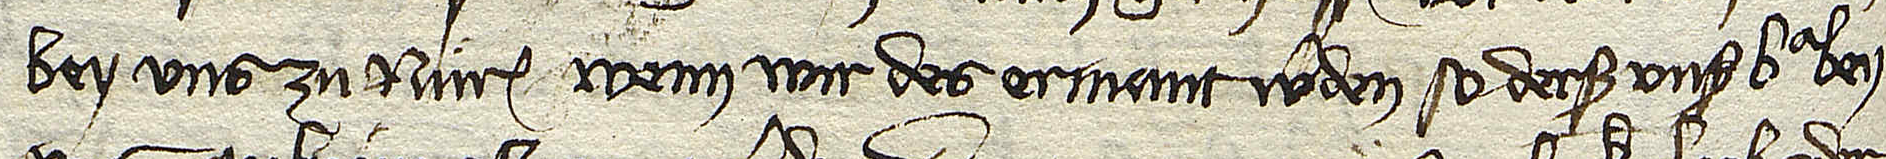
bey vns ʒu Nür* wenn wir des ermant w*den ſo derſ* vnſ* b* bey
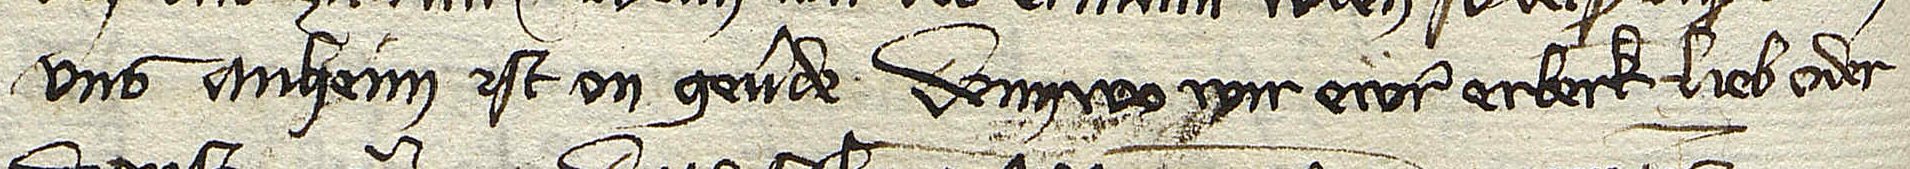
vns anheim iſt on geu*de . Denn wo wir ew*r erberk* lieb oder
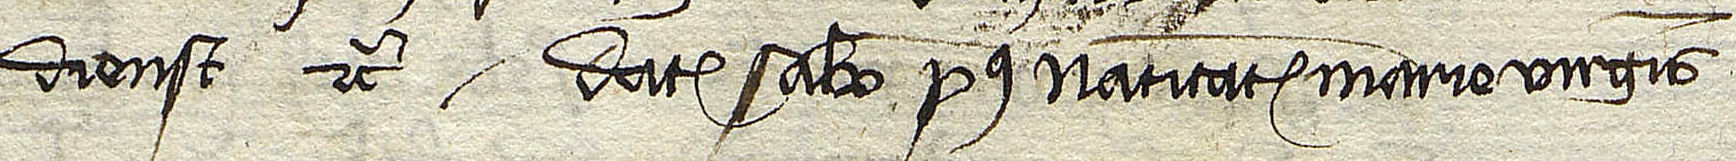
dienſt ec* / Dat* ſabo* p* Natitat* marie virgi*s
